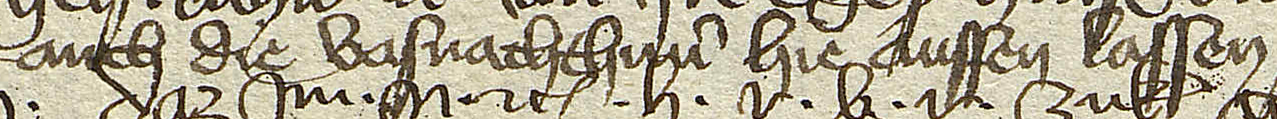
auch die vaſnachthun* hie auffen laſſen /
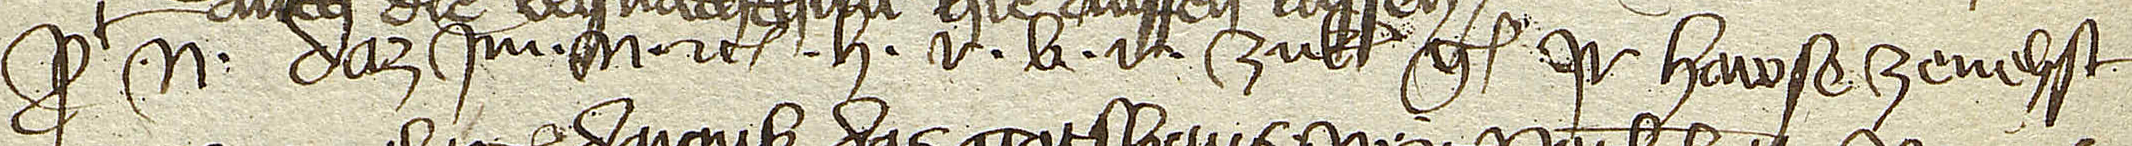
P* . N. daʒ Im . N . ec* . h. r. b. r. cʒuk* g* Ir hawſe cʒenehſt
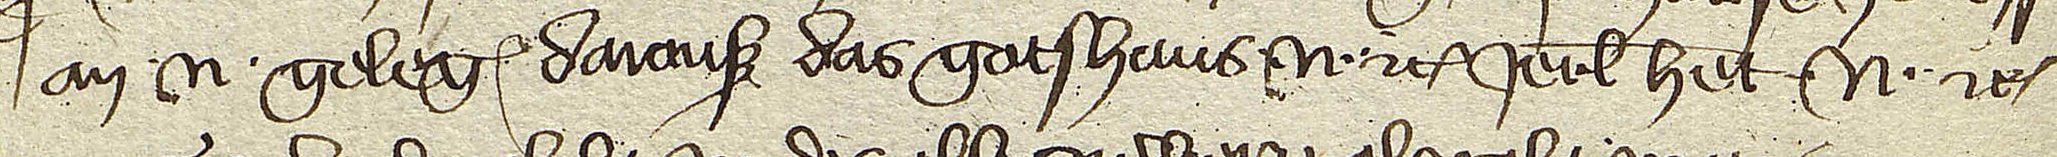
an N. geleg* darauſʒ das gotſhaus . N . ec* Ierl* het . N. ec*
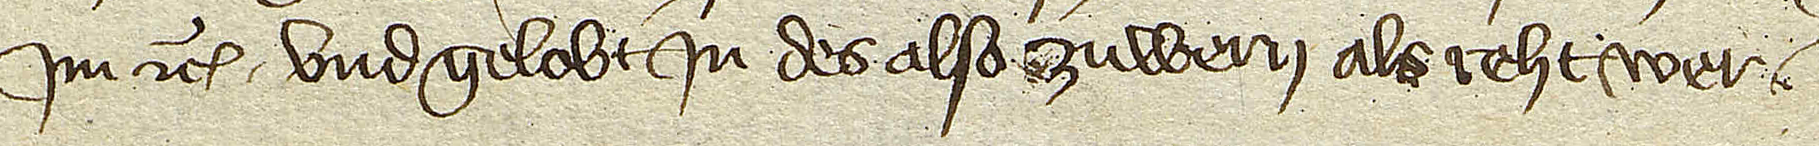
Im ec* / vnd gelobt In des alſo cʒewern als reht wer /
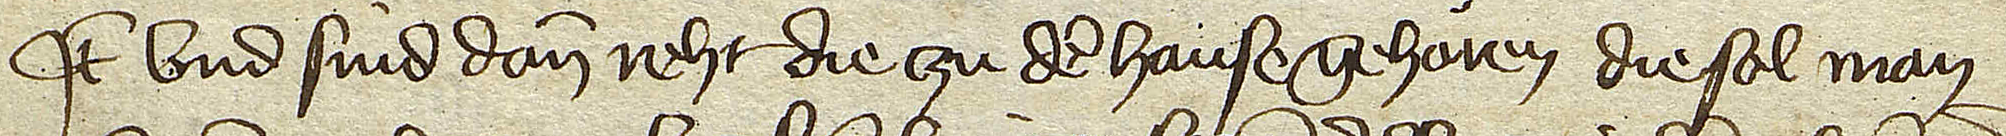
It* vnd ſind dan* reht die cʒu de* hauſe gehören die ſol man
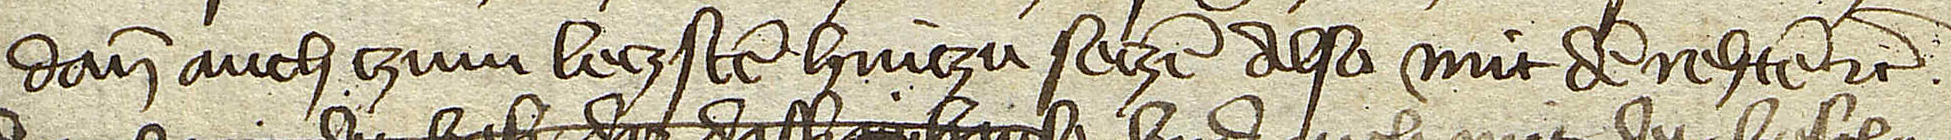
dan* auch cʒum lecʒſte* hincʒu ſecʒe* Alſo mit d* rehte* ec*
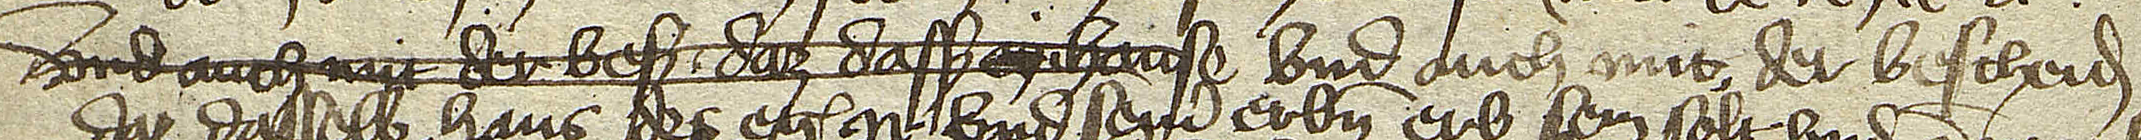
vnd auch mit der beſ* / daʒ daſſ* ey hauſe vnd auch mit der beſcheid*
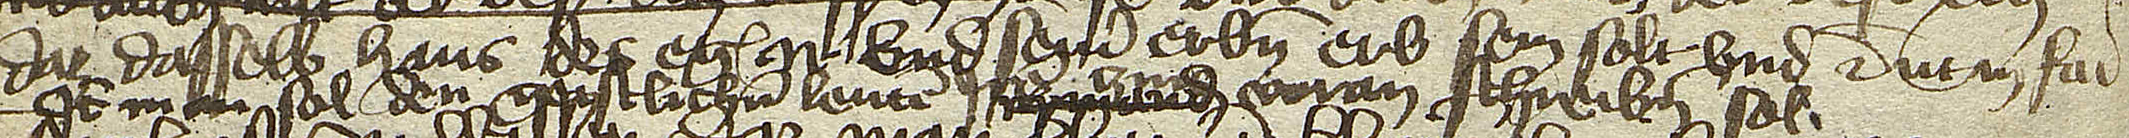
daʒ daſſelb haus des eg* N. vnd ſein* erbn* erb ſein ſolt vnd ec* ut in for*
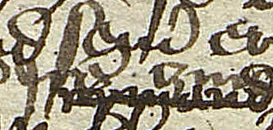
Ire cʒum
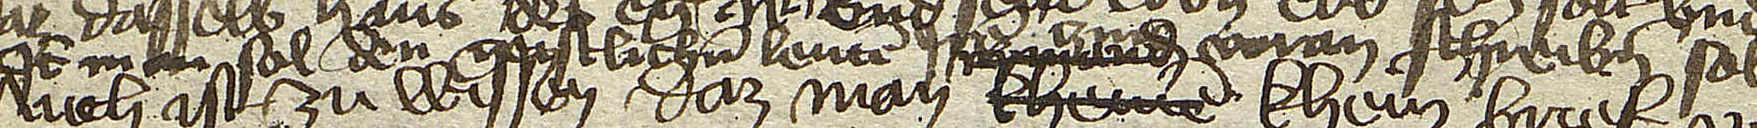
It man ſol / den geiſtlichn* leute* yemand* voran ſchreibn* ſol .
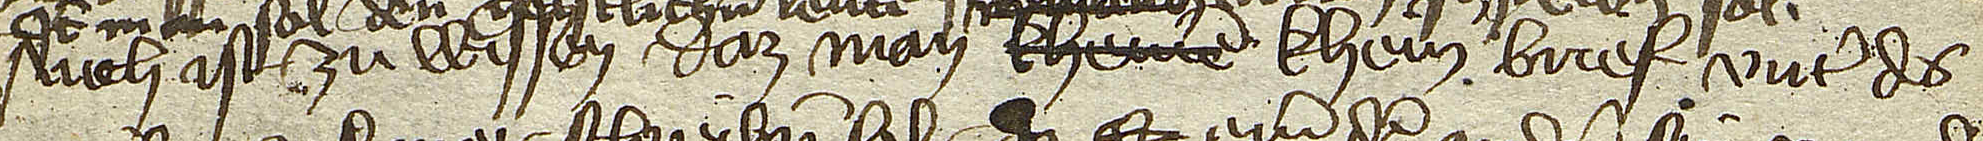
Auch iſt cʒu wiſſen / daʒ man kheine* khein brief vnt* des
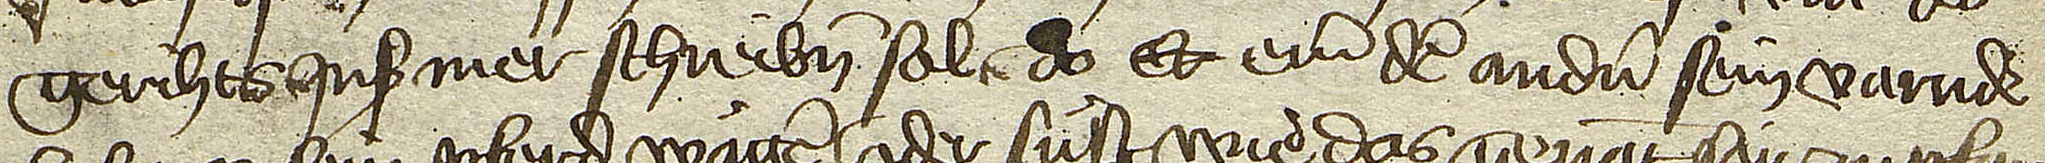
gerichts Inſ* mer ſchreibn* ſol / do Er ein* de* andn* ſein varnde
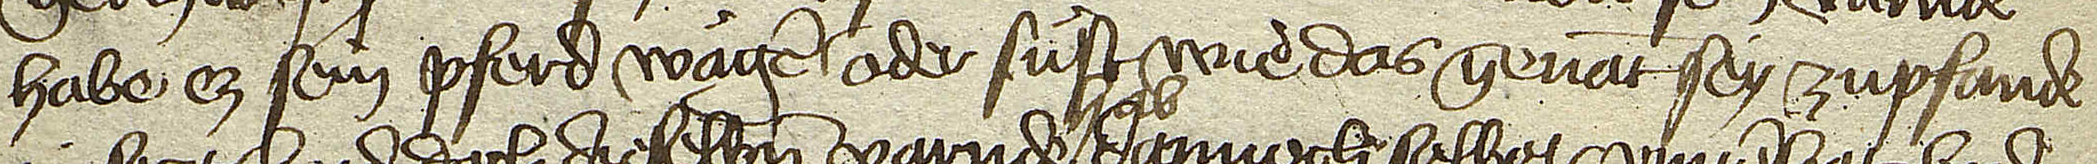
habe eʒ ſein pferd wäge* / oder ſüſt wie das genat* ſey cʒupfande
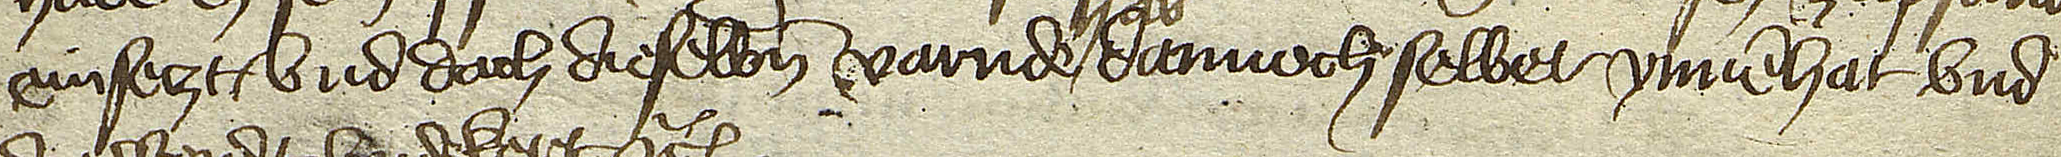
einſecʒt / vnd doch dieſelbn* varnde / dannoch ſelber ynne* hat vnd
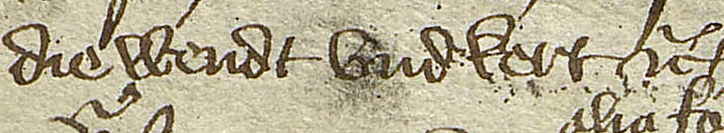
die wendt vnd kert ec*
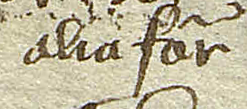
alia for*
